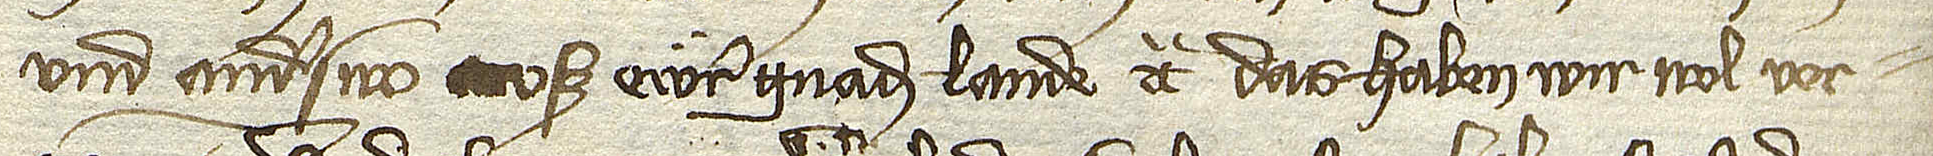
vnd and*ſwo awſʒ ew*r gnad* lande ec* das haben wir wol ver =
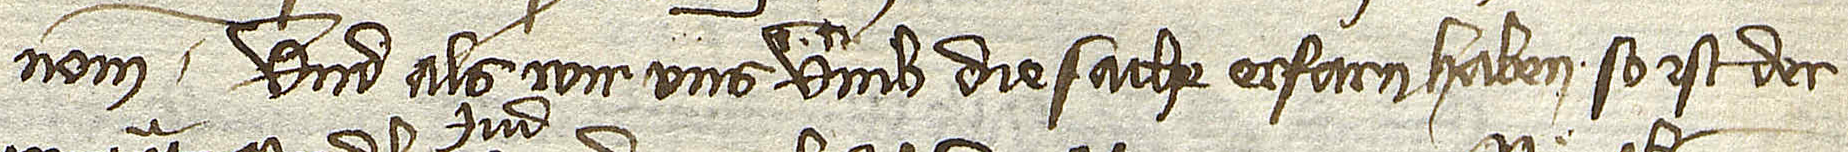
nom* / Vnd als wir vns Vmb die ſache erfarn haben . ſo iſt der
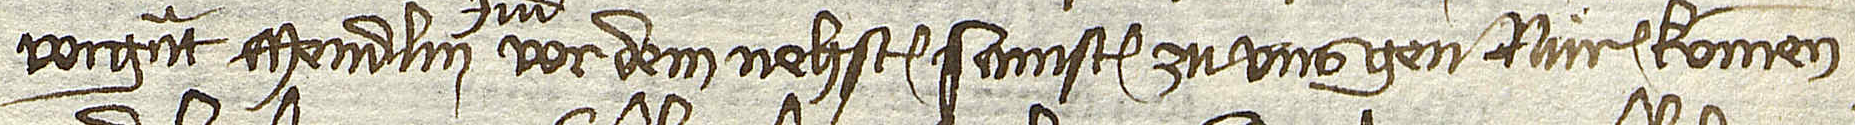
vorg*nt Mendlin vor dem nehſt* ſamſt* ʒu vns gen Nür* komen*
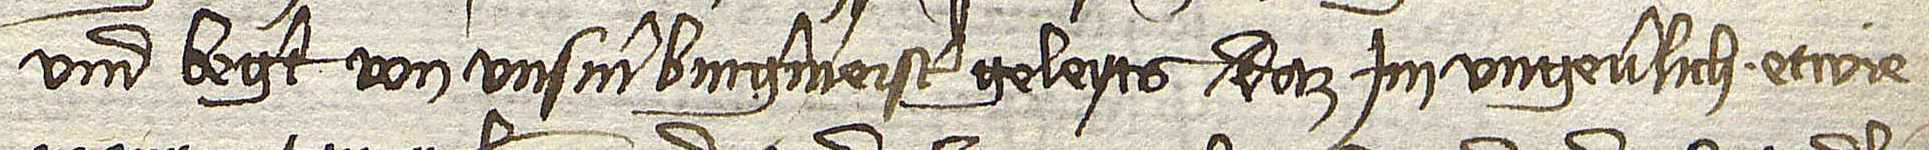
vnd beg*t von vnſ*m burg*meiſt* geleyts / daʒ Im vngeulich . etwie
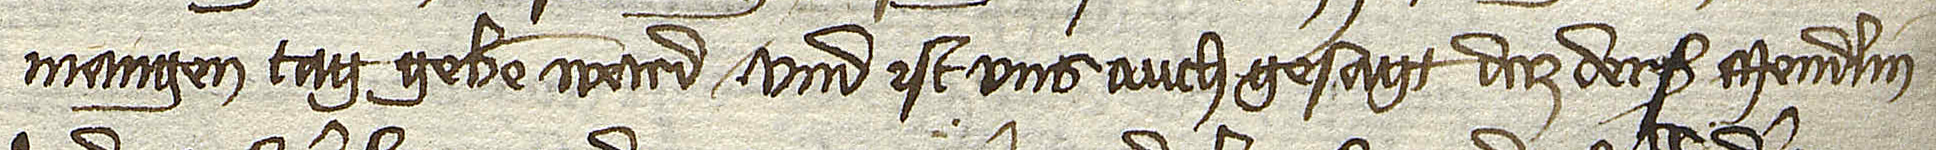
mangen tag gebe* ward / vnd iſt vns auch geſagt daʒ derſ* Mendlin
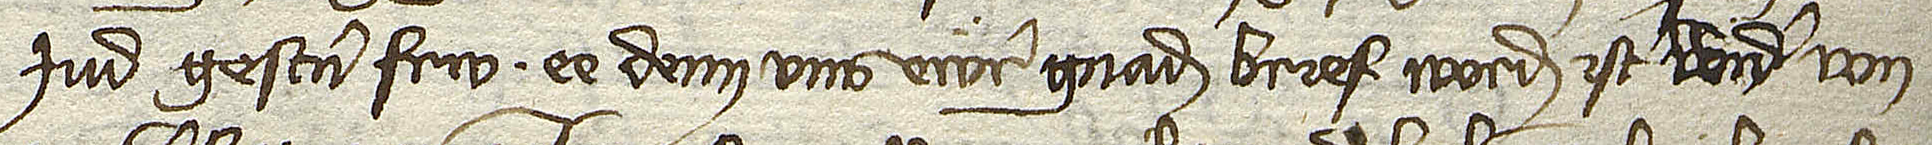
Iud geſt*n frw . ee denn vns ew*r gnad* brief word* iſt Wid* von
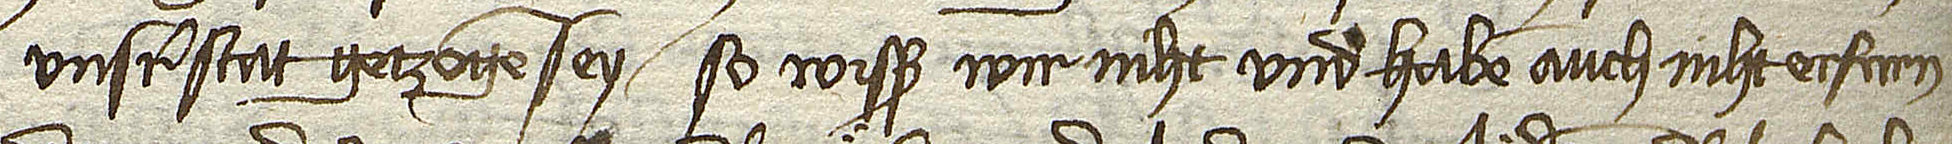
vnſ*r ſtat gecʒoge* ſey ſo wiſſ* wir niht vnd habe* auch niht erfarn
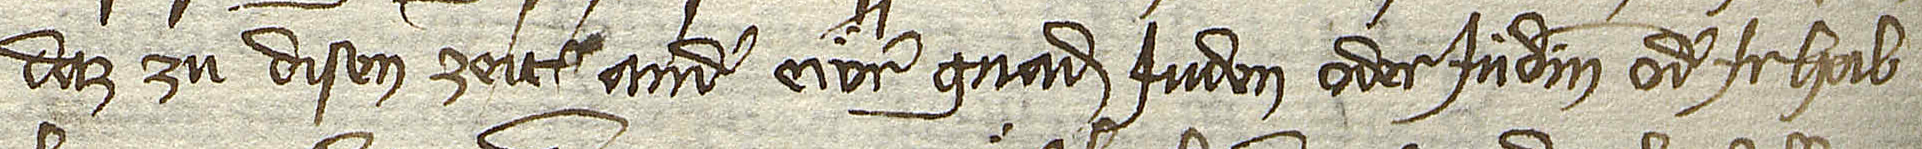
daʒ ʒu diſen ʒeit* and* ew*r gnad* Iuden oder Iüdin* od* Ir hab
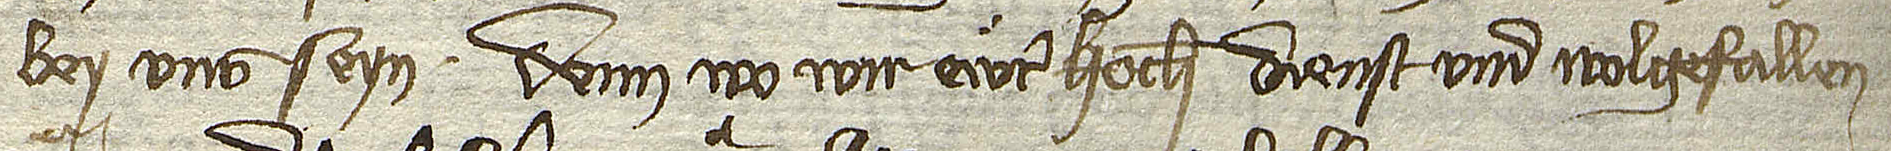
bey vns ſeyn . Denn wo wir ew*r hoch* dienſt vnd wolgefallen
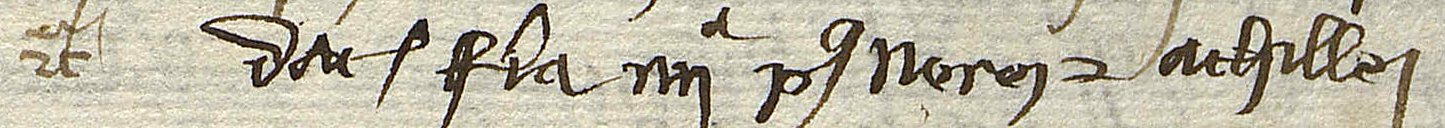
ec* Dat* fia* iiii* p* Nerei @ achillei
